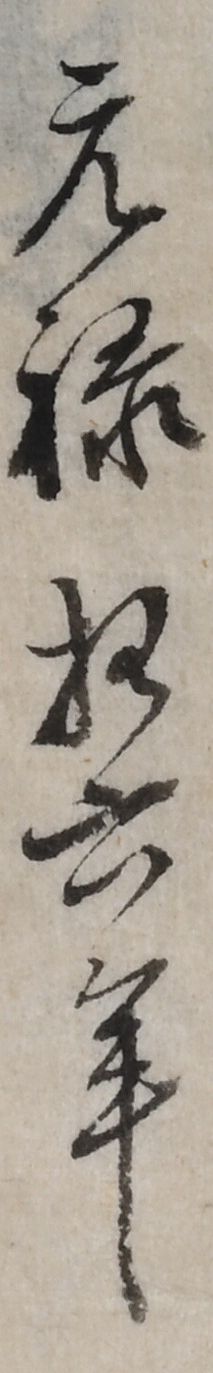元禄拾六年
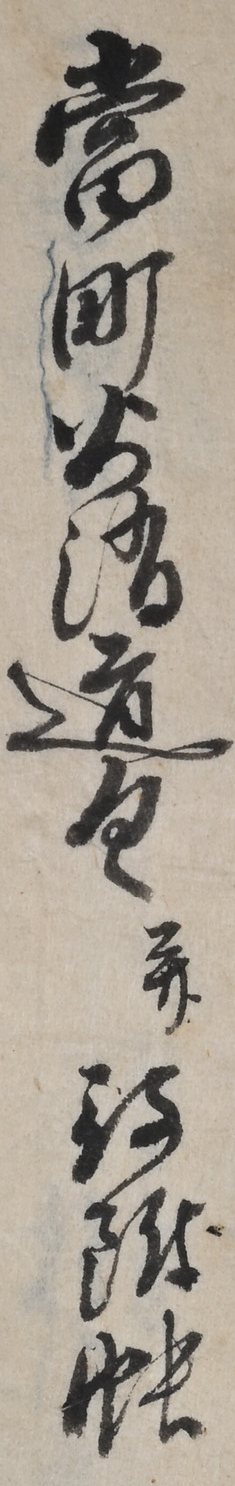当町火消道具并役附帳

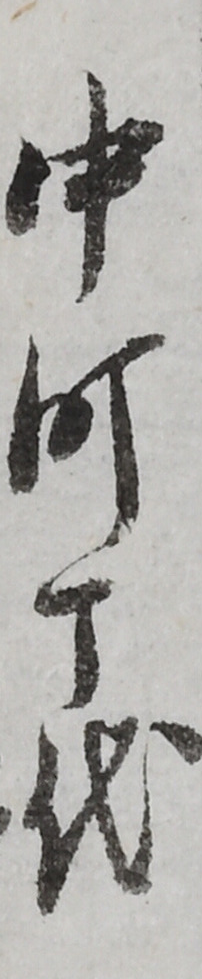中町丁代
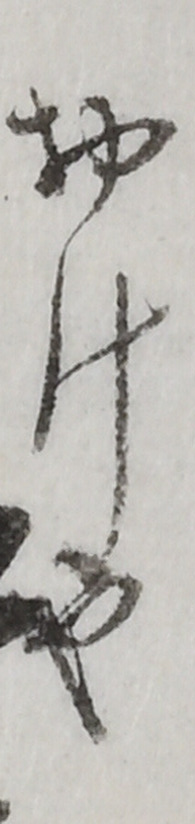おけや
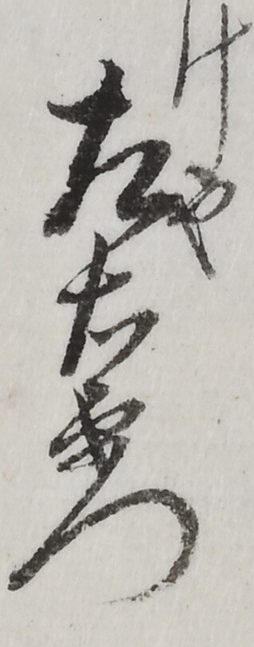勧右衛門
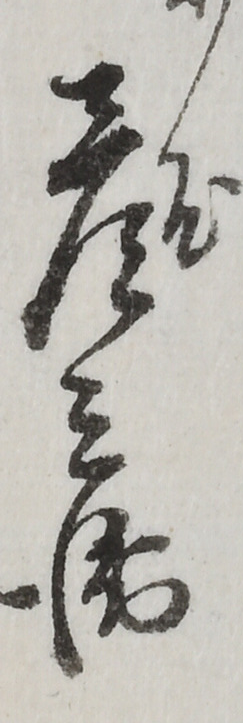彦兵衛
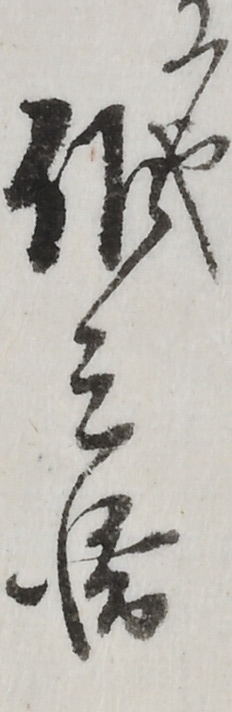彦兵衛
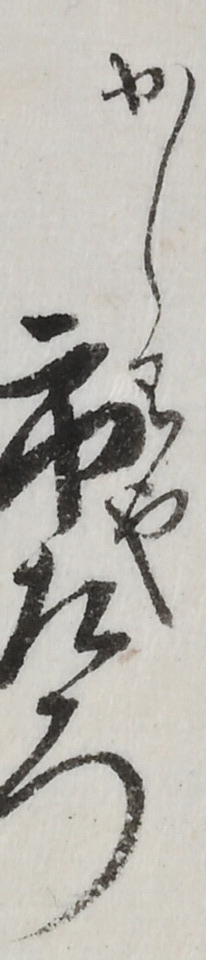市左衛門
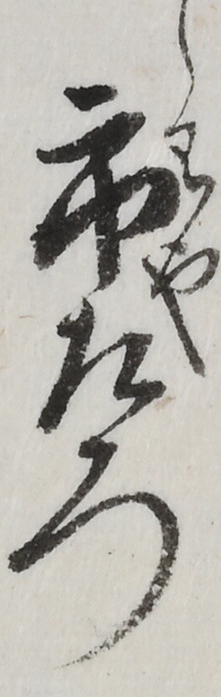市左衛門
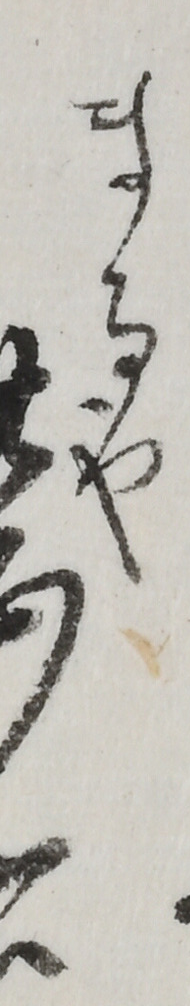まるや
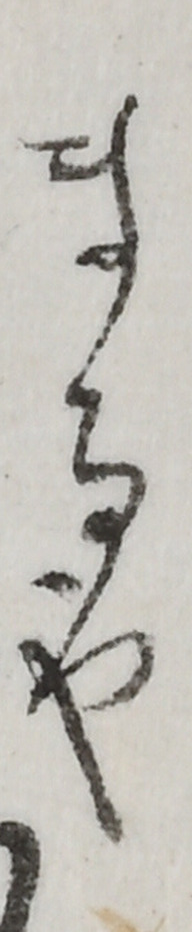まるや
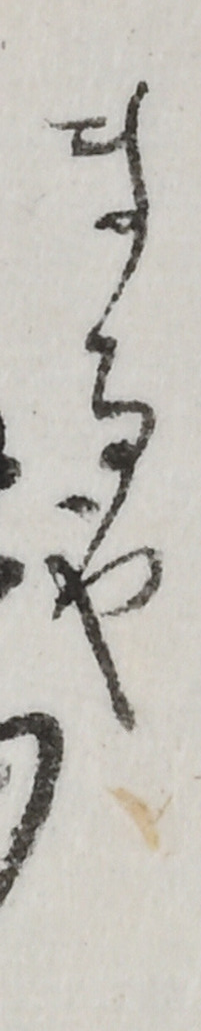まるや
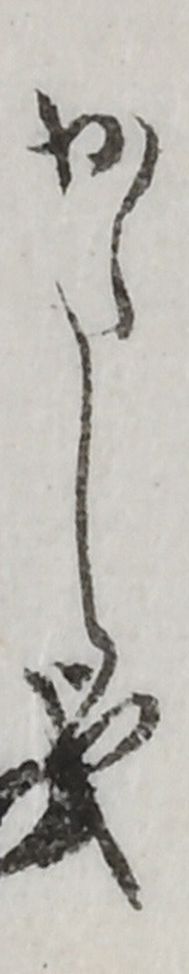かゝしや
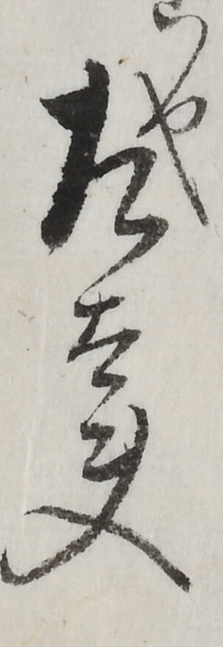左太夫

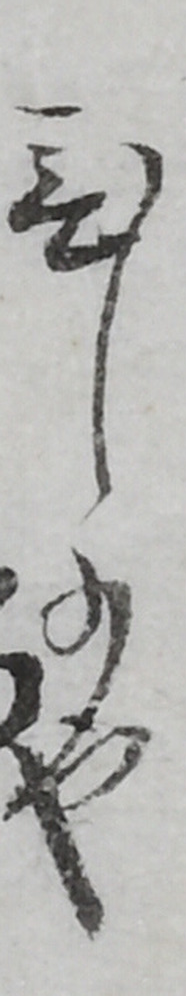ひしのや
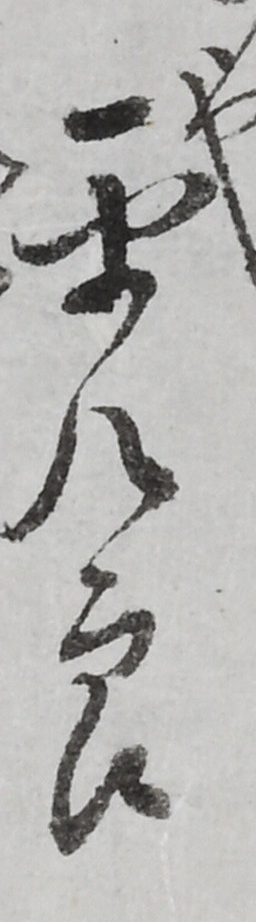平八郎
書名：當町火消道具幷役附帳
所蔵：伊那市立高遠町図書館・合同会社AMANE
